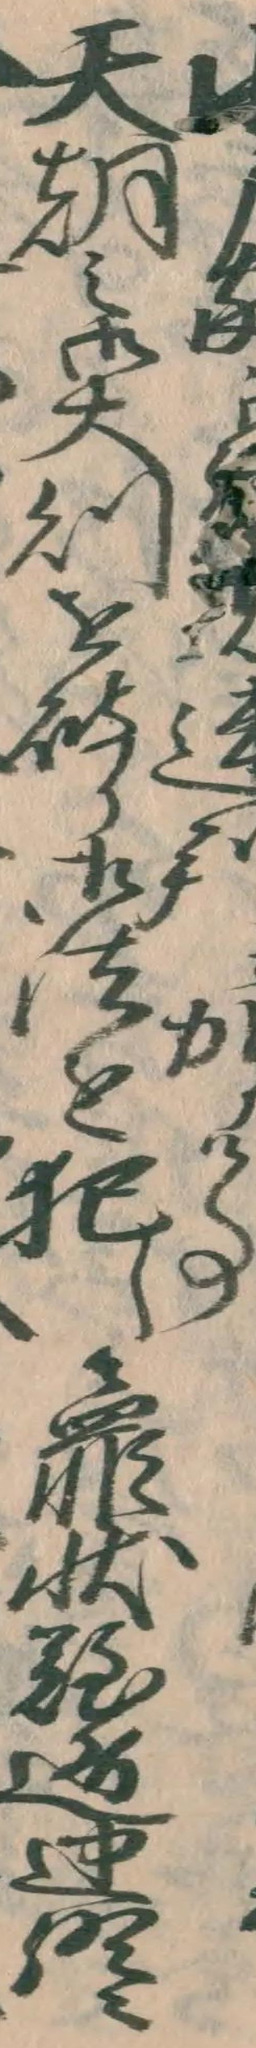天朝之御大則を破り御法を犯し候罪状難遁迚終ニ
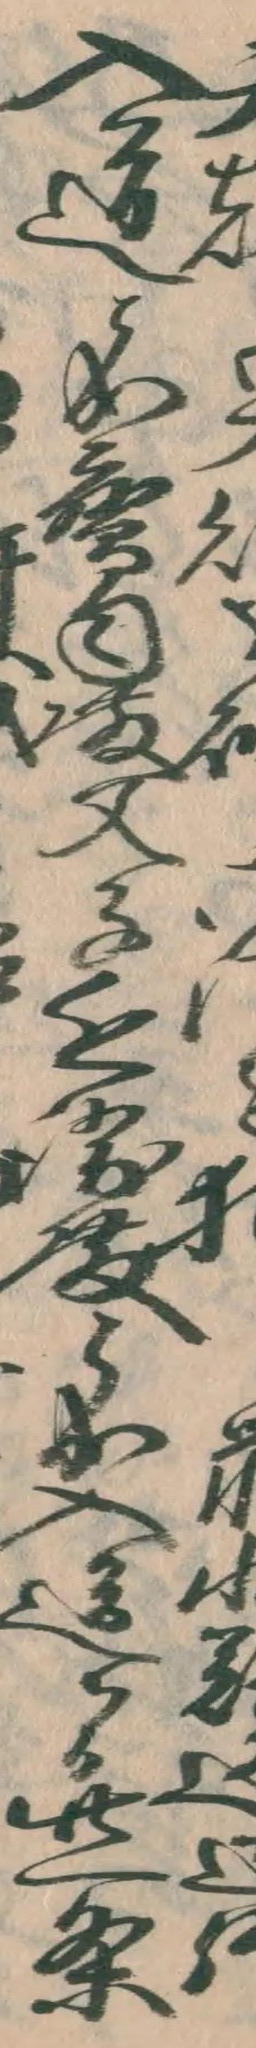入道被成鷹司殿父子近衛殿被成入道ニ而此一条
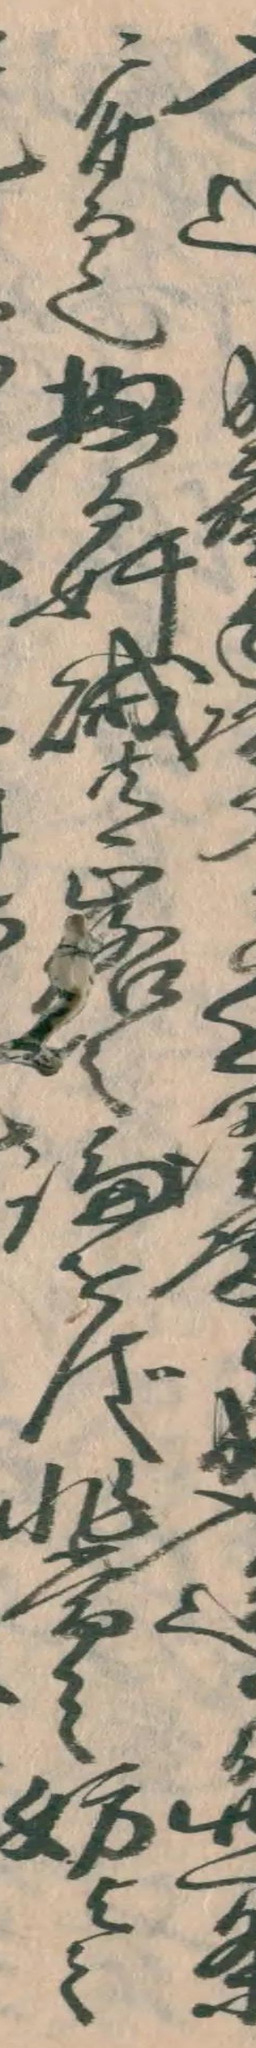ニ付而也惣而奸賊共正路之論をば非常之妨と者
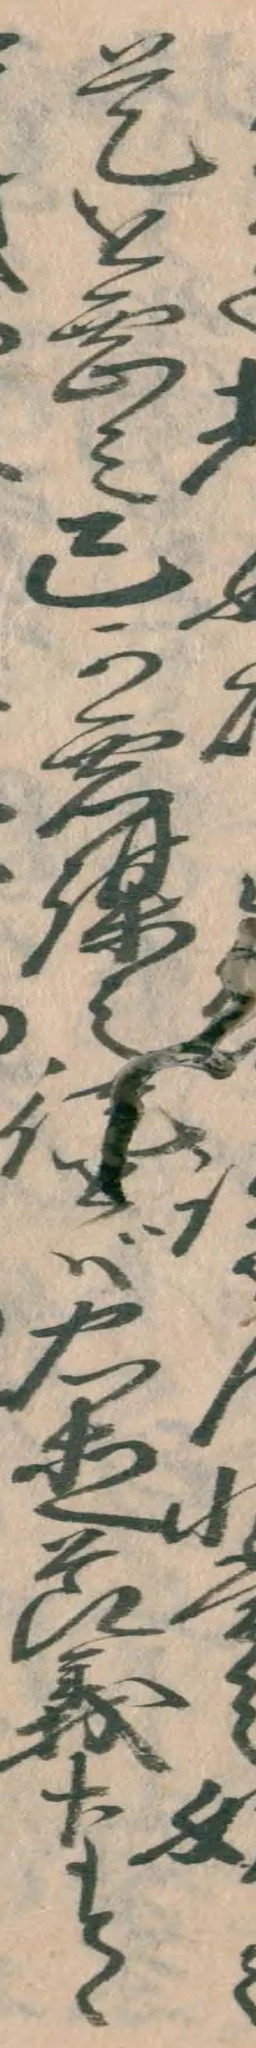是を悪ミ己か悪謀之徒をバ忠直節義なとヽ
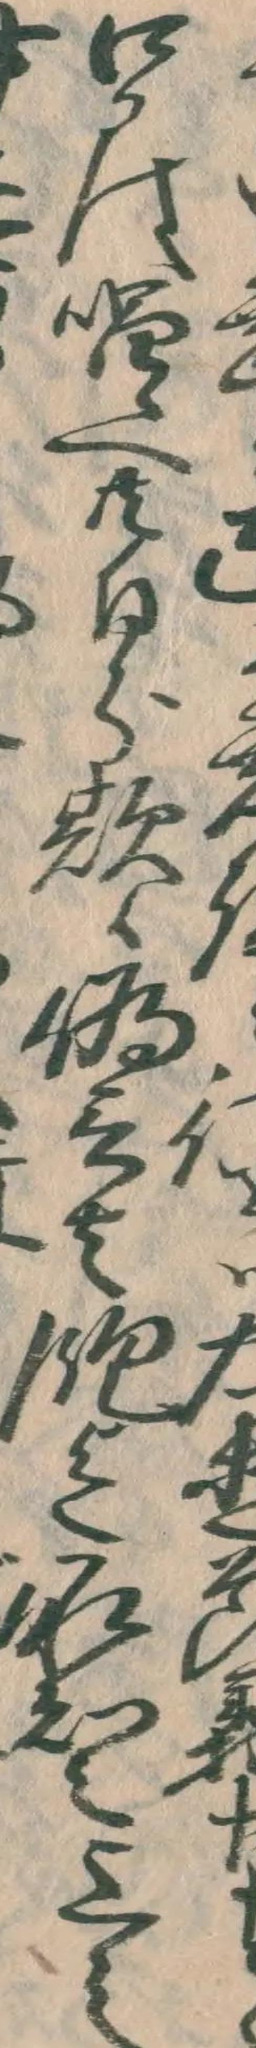口には唱候へ共自ら欺候偽言者飽迄承知之上之
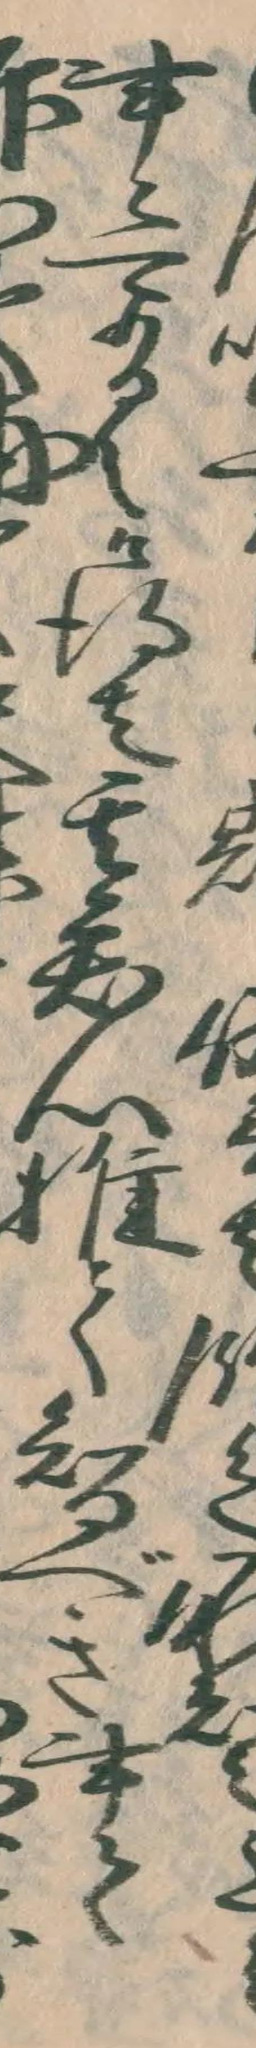事ニ可有之候得者其異心推て知るべき事ニ候
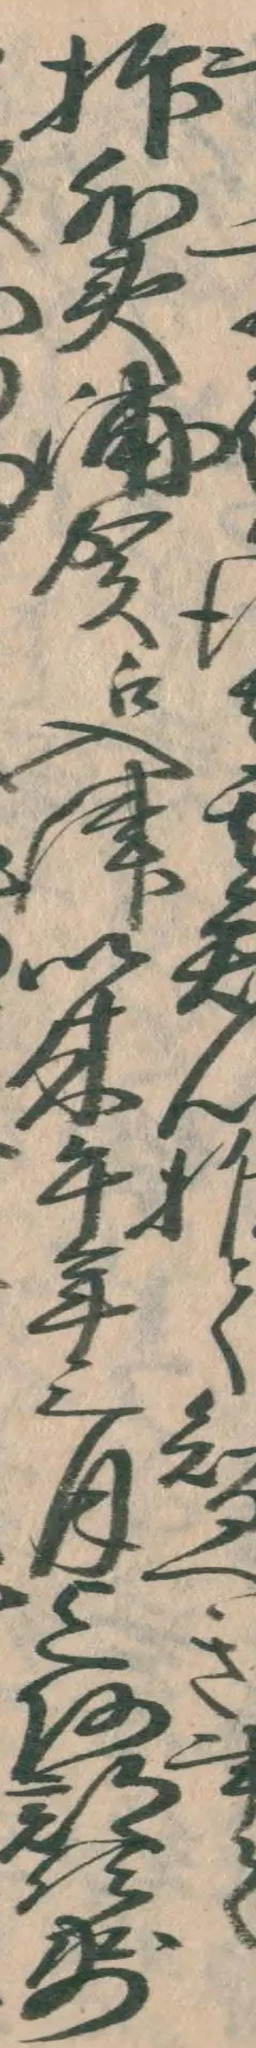抑外夷浦賀江入津以来午年三月迄阿部伊勢
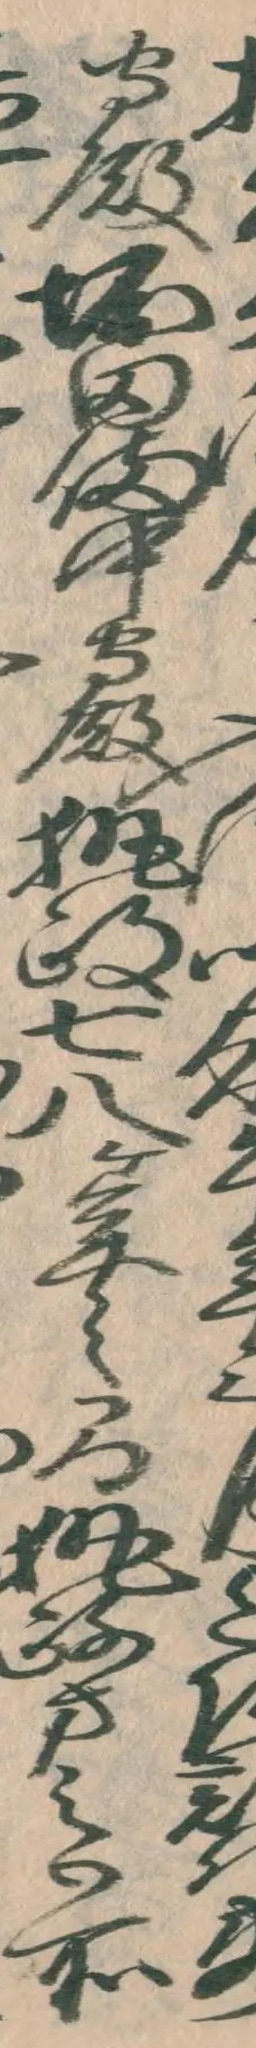守殿掘田備中守殿執政七八ケ年之間執政方之御所
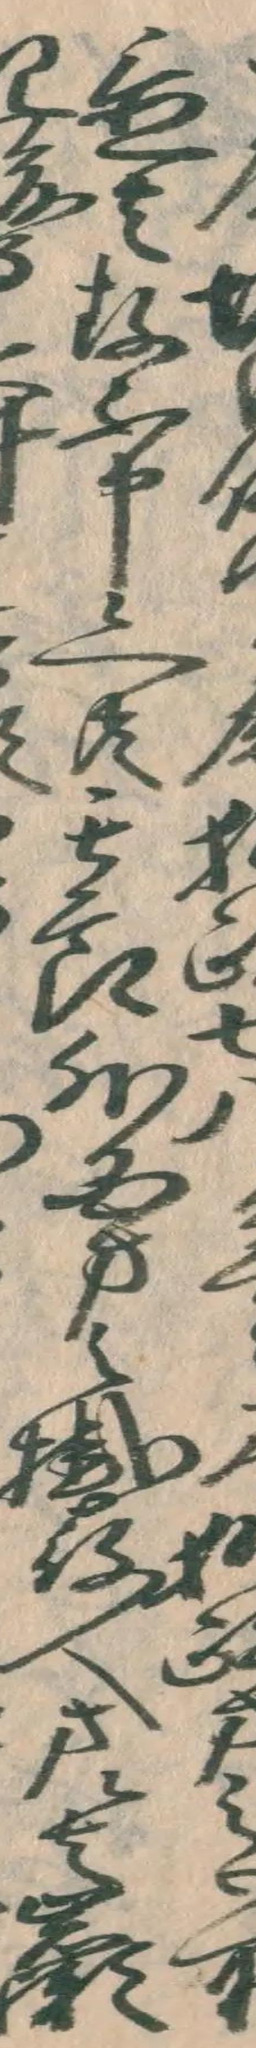置者存不申候へ共其節外国方之掛御役人方ニ者岩瀬
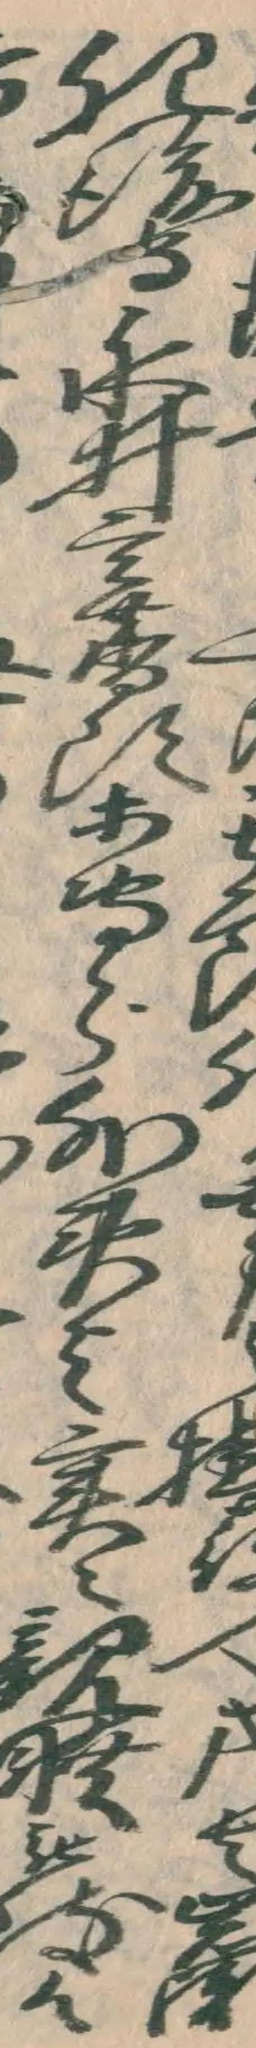肥後守永井玄番頭等専ら外夷と実ニ親睦被致候
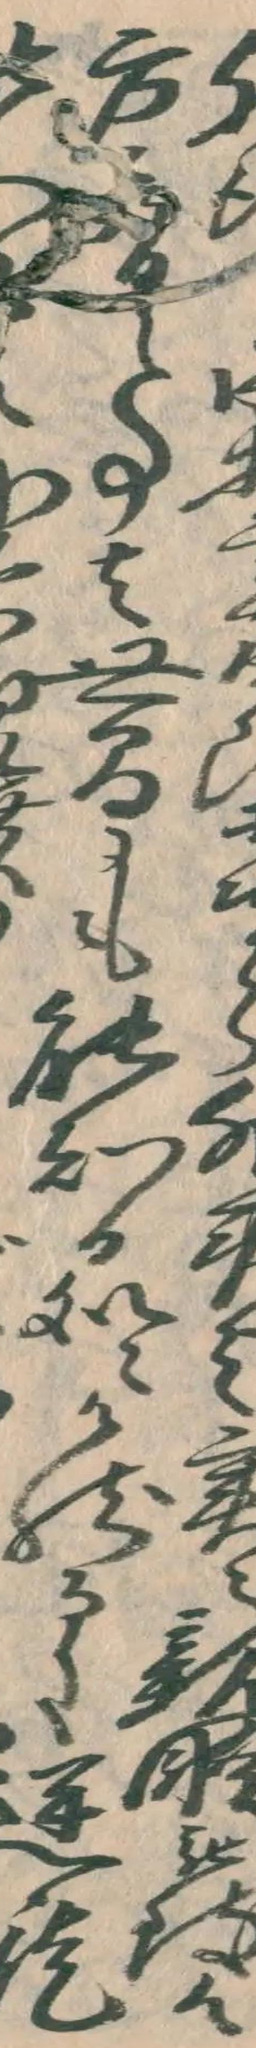方ニ有之事者世間にも能知る処ニ候然るに逆徒
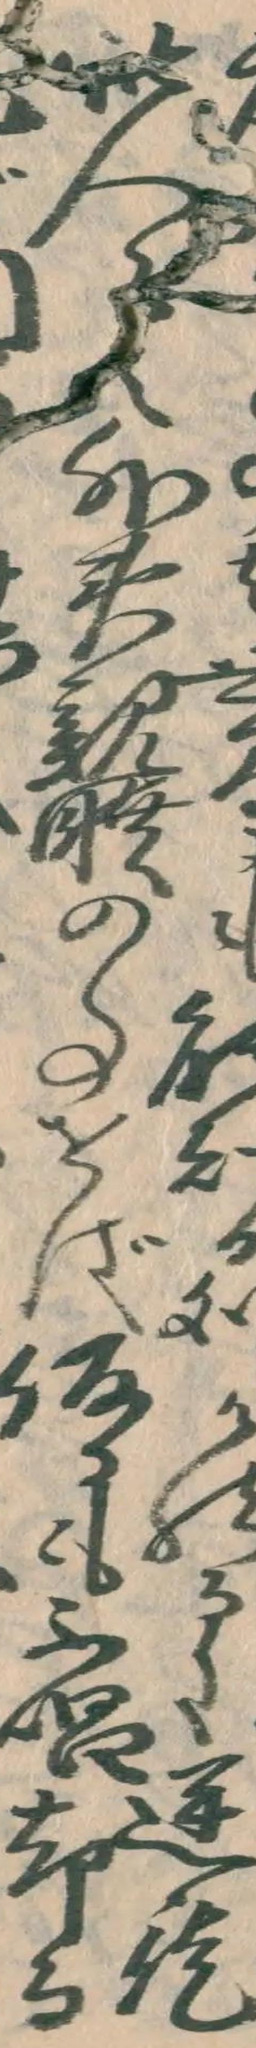此人々之外夷親睦の事をば仮にも不唱却而
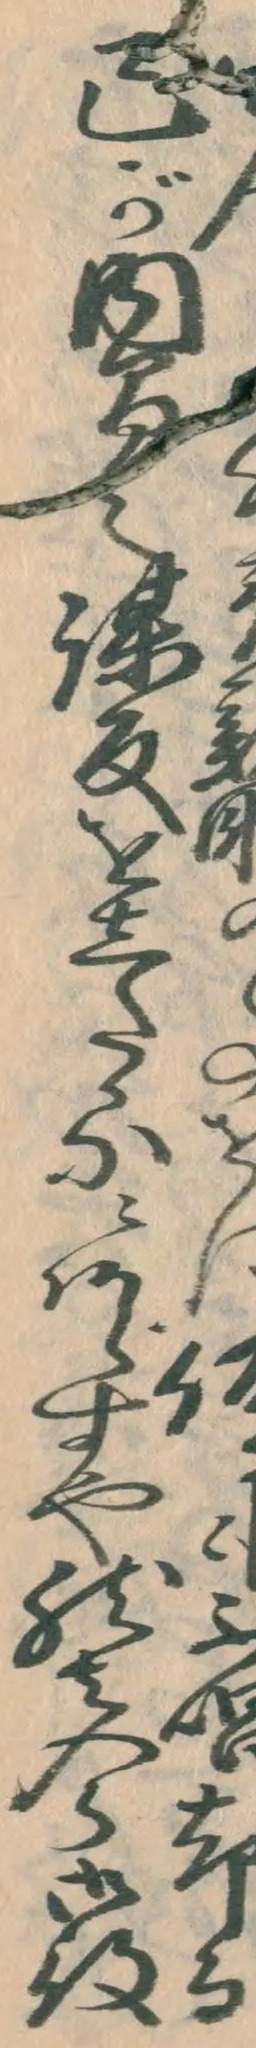己が内間之謀反をしたるニあらすや然者今御役

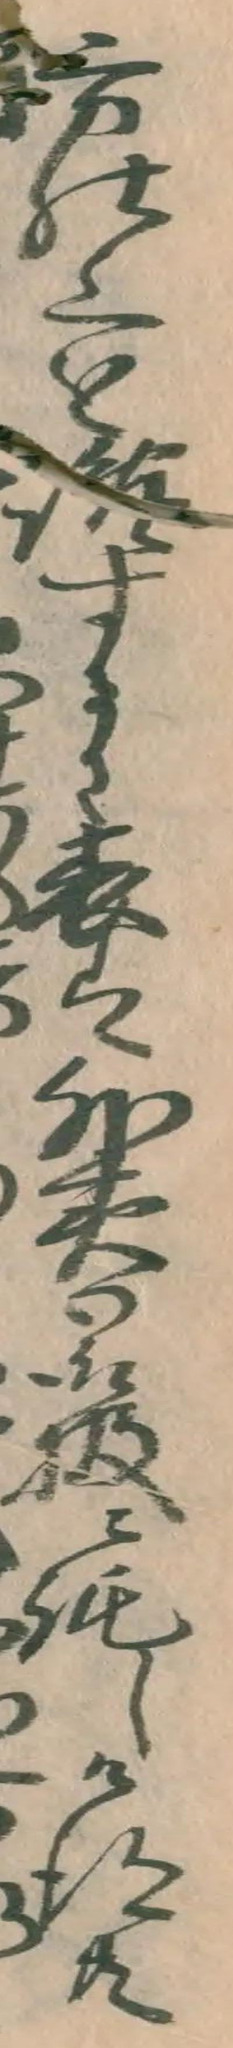方の上を讒するに表は外夷御取扱ニ託し候得共
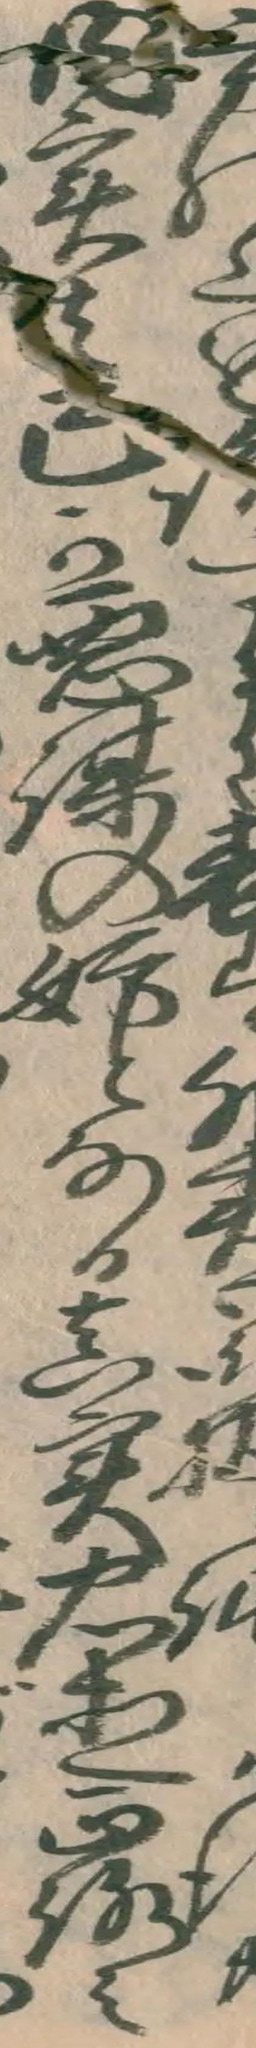内実者己か悪謀の妨となる真実忠直正路之
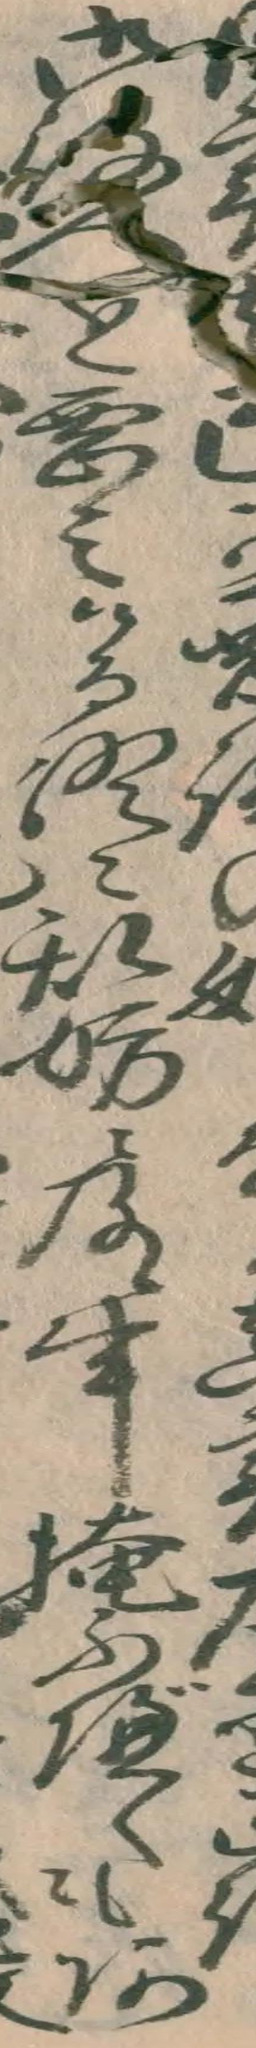御役人を悪ミ候て終ニ乱妨ニ及候事掩ふべくもあ
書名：麗斎叢書. 20
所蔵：国立国会図書館 National Diet Library, JAPAN
